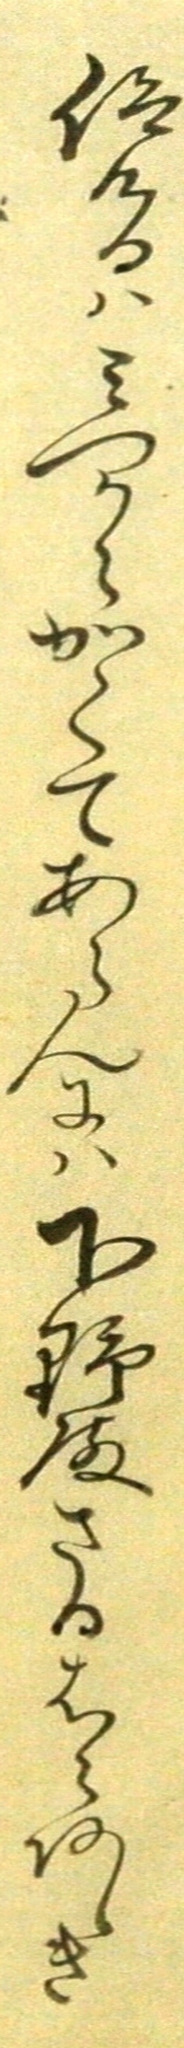仰けるはみつからかくてあらんには下野殿さるはらあしき
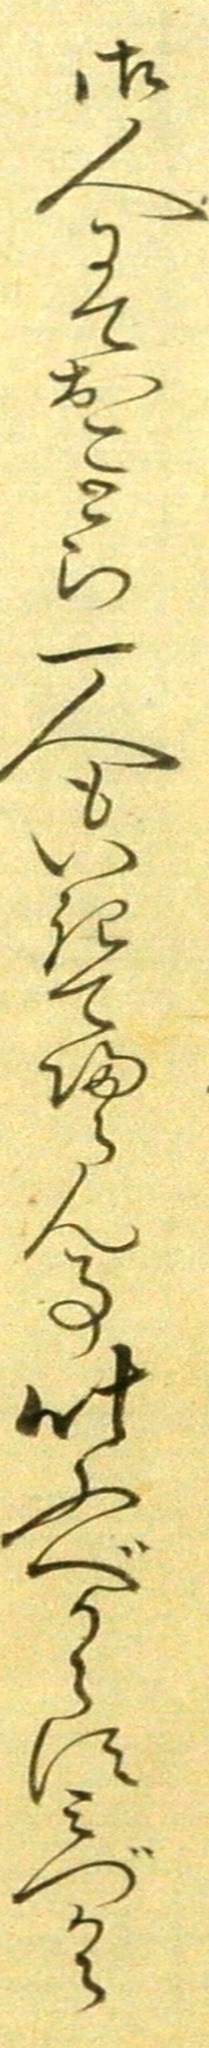御人にておことら一人もいきて帰らん事叶ふべからすみづから
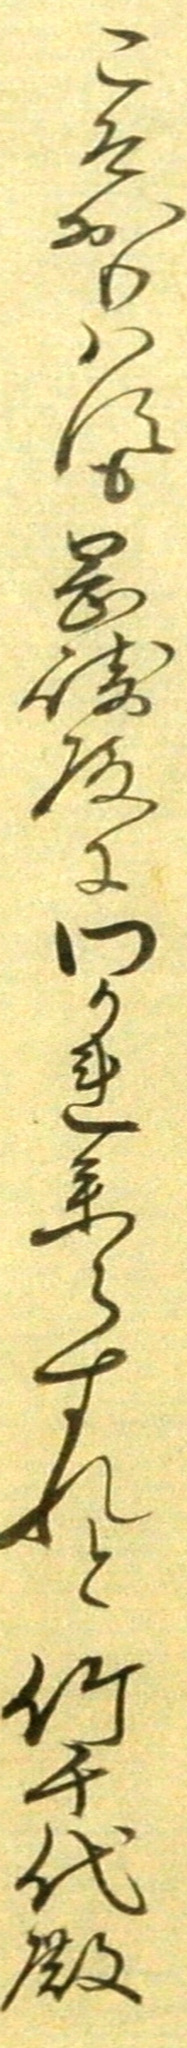こそおもはすも岡崎殿にわかれ参らすれと竹千代殿
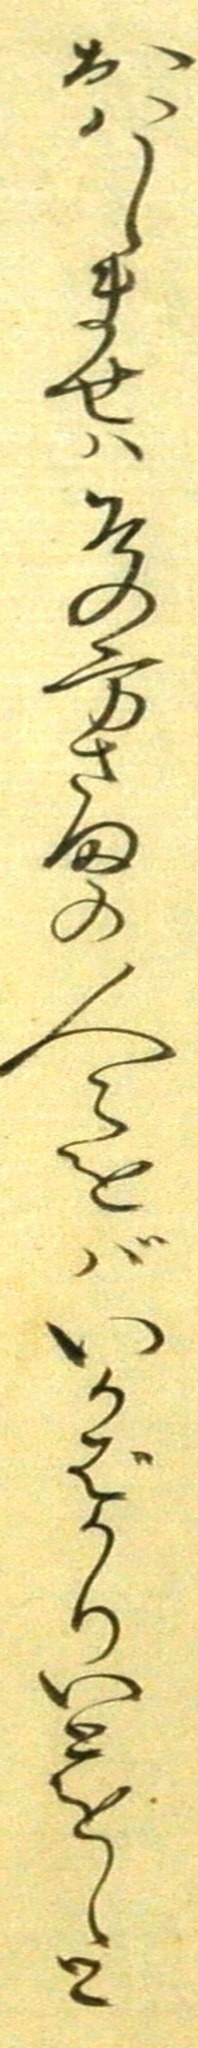おはしませはその方さまの人々をばいかばかりいとをしと
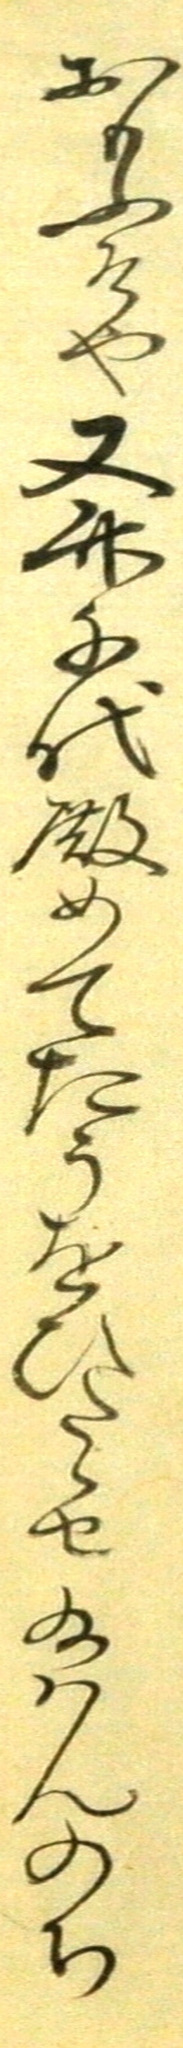おもふそや又竹千代殿めてたうをひたゝせ給はんのち
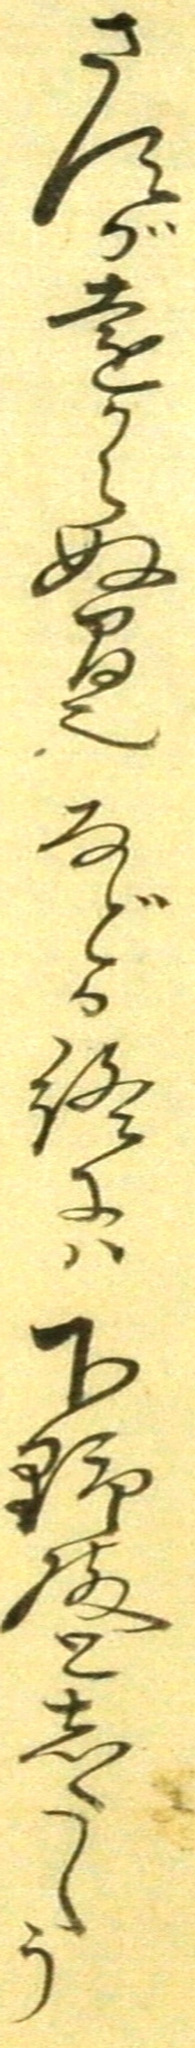さすが遠からぬ間也などか終には下野殿としたしう
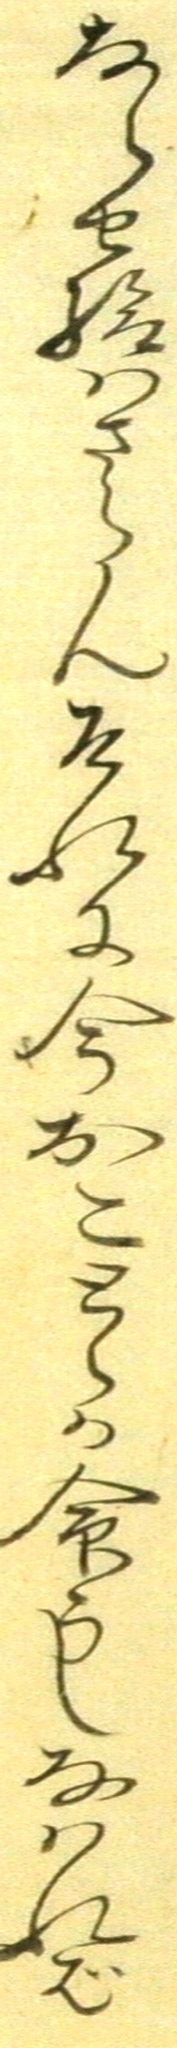ならせ給はさらんそれに今おことらか命うしなはれば
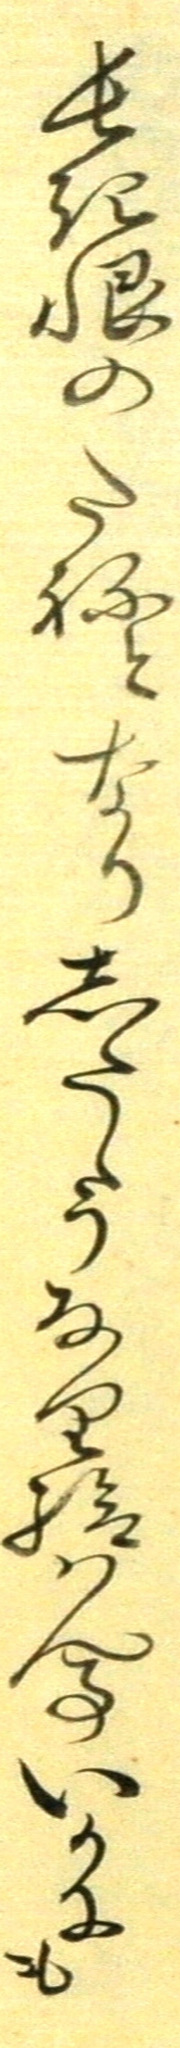長き恨のたねとなりしたしうなり給はん事いかにも
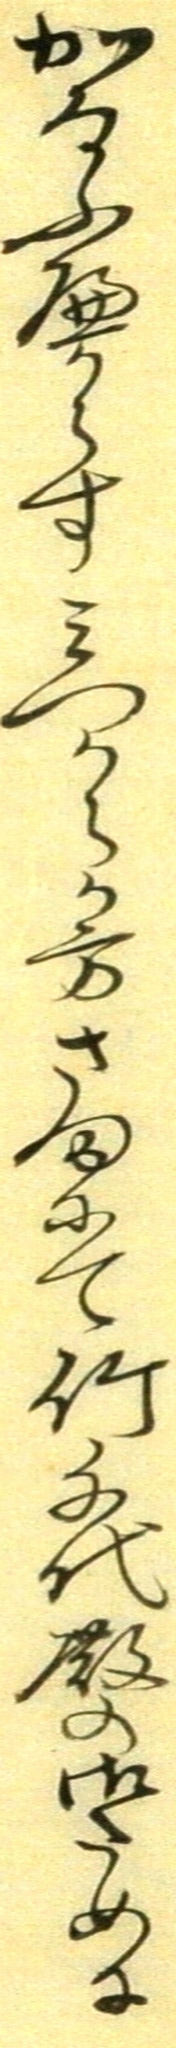かなふへからすみつから方さまにて竹千代殿の御ために
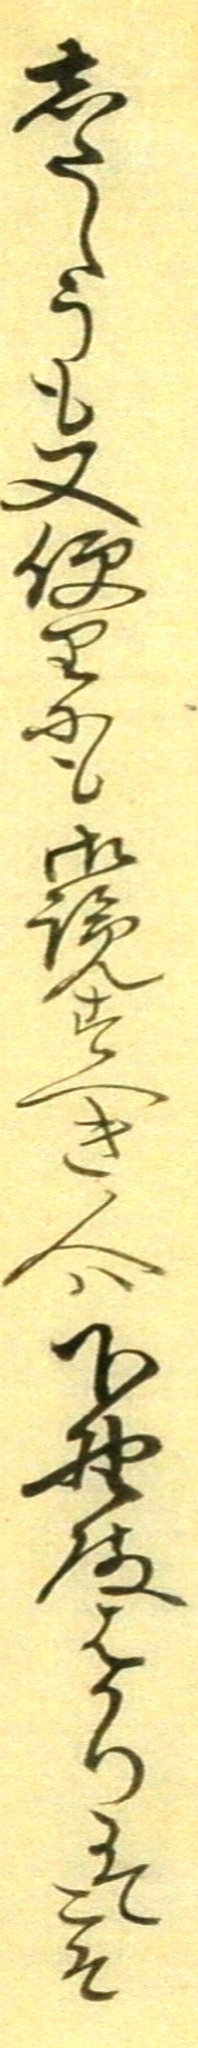したしうも又便りにも御覧すへき人は下野殿はかりにてこそ
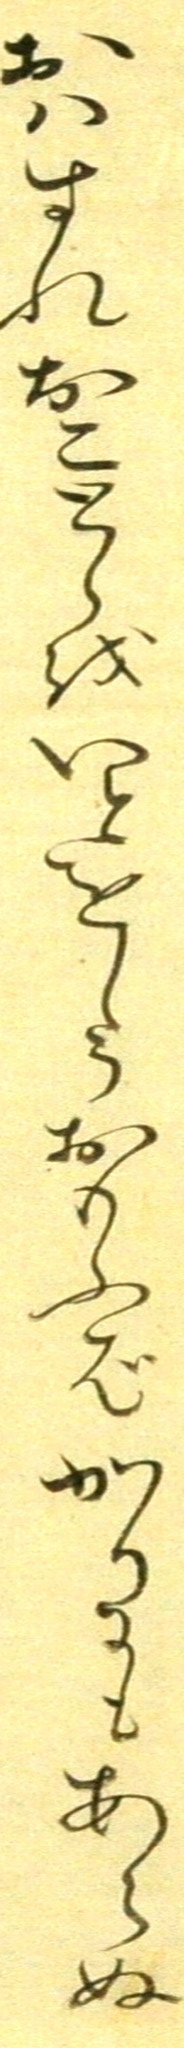おはすれおことらをいとをしうおもふばかりにもあらぬ
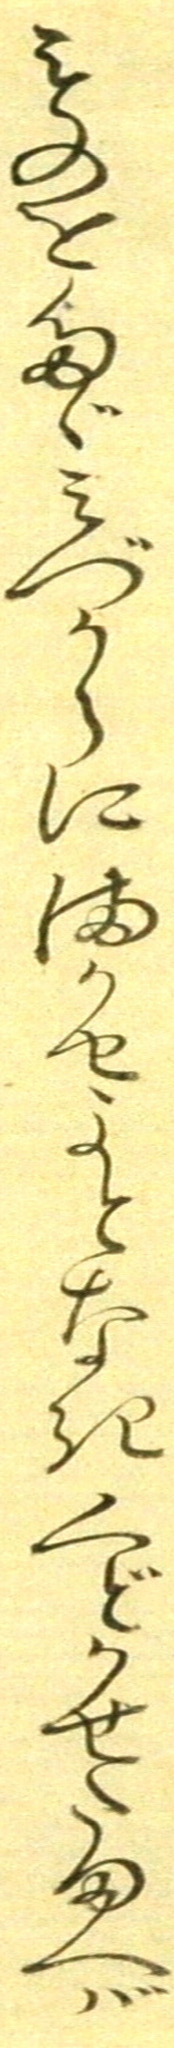ものをたゞみづからにまかせよとなきくどかせたまへば
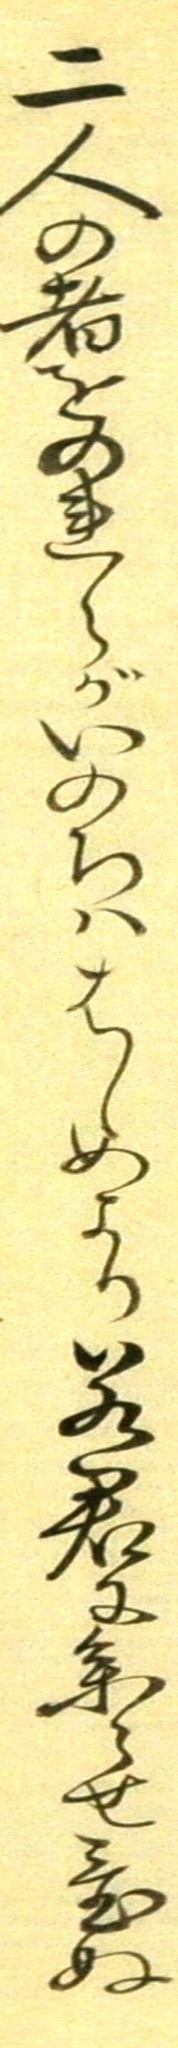二人の者をのれらがいのちははしめより若君に参らせ置ぬ
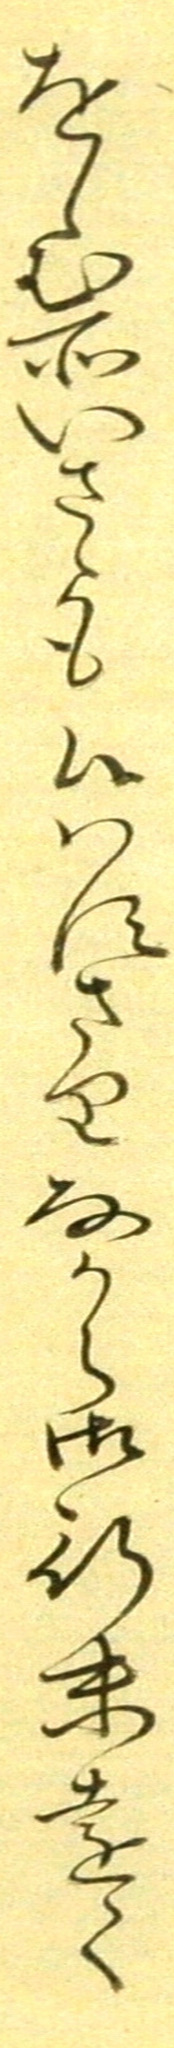をしむ所いさゝかも候わすさりなから御行末遠く
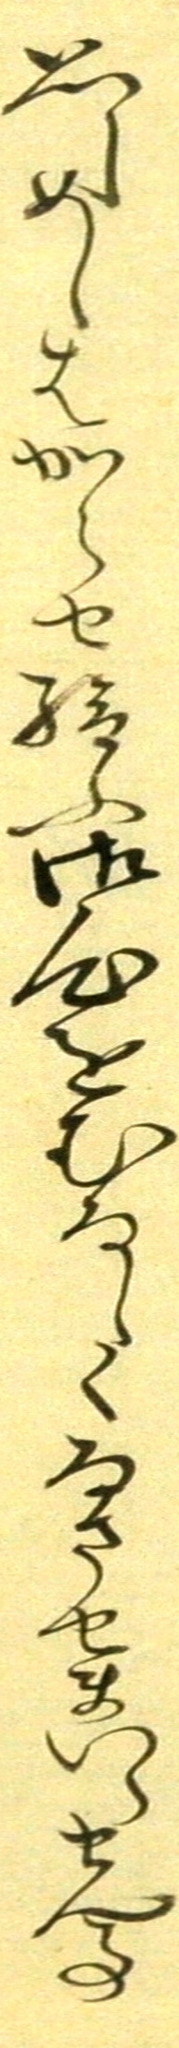思しめしはからせ給ふ御心をむなしくなさせまいらせん事
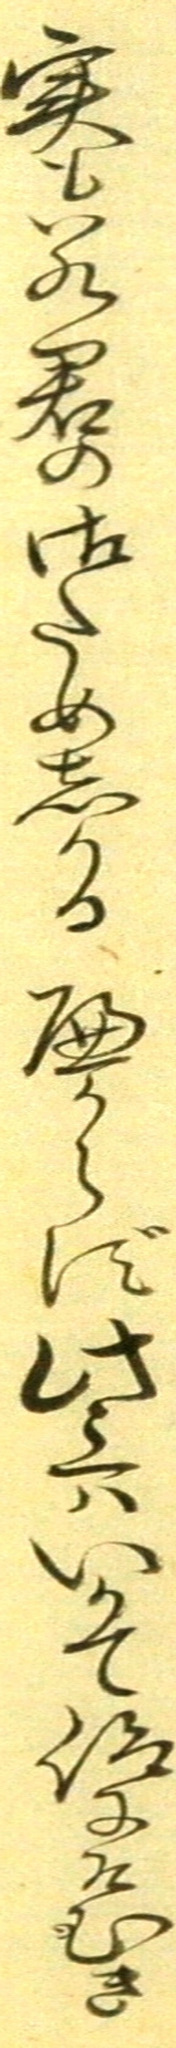実も若君の御ためしかるへからず此上はいかて仰にそむき
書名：藩翰譜（五）
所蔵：伊那市立高遠町図書館・合同会社AMANE
